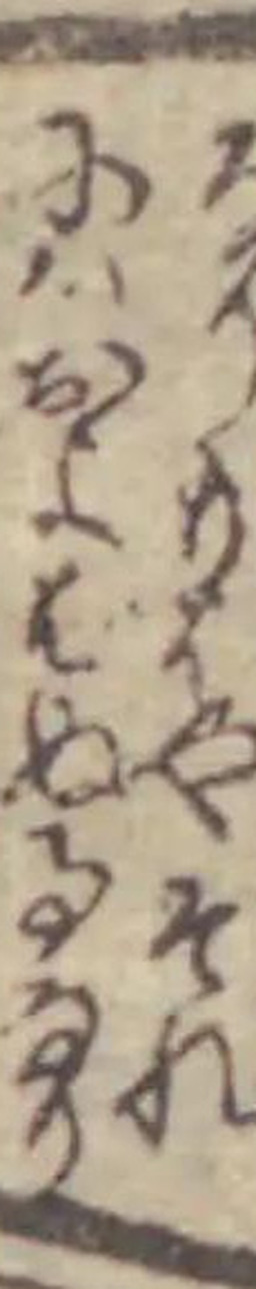にはおよばぬ事なり
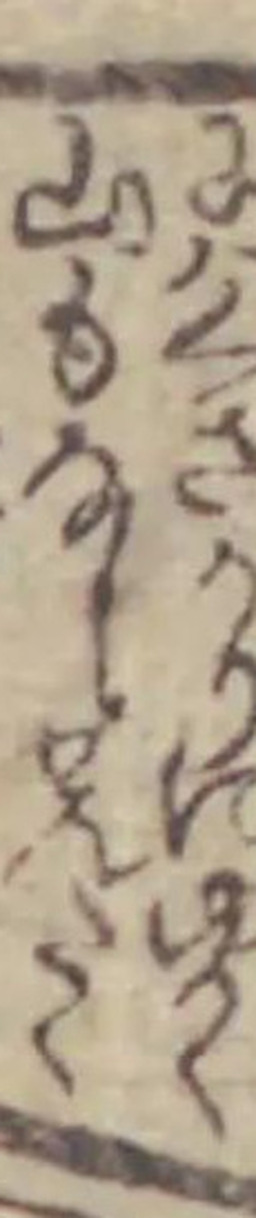山もなしせんたく
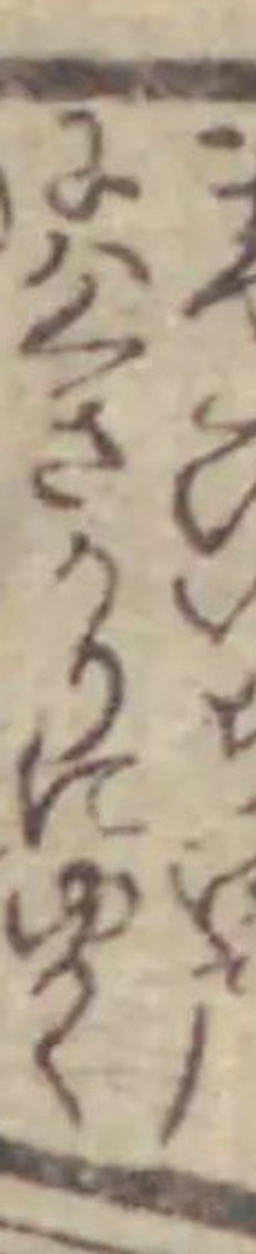にはくさかりにゆく
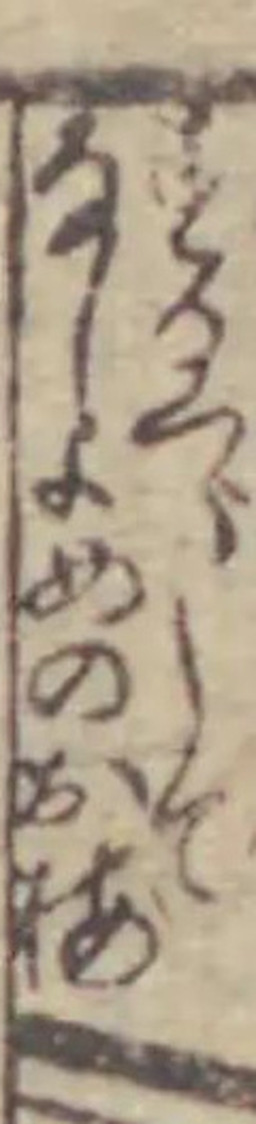なしよめのお梅
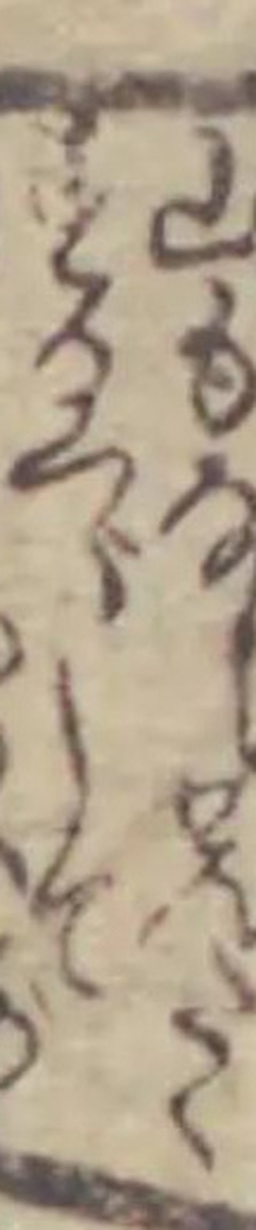するくらして
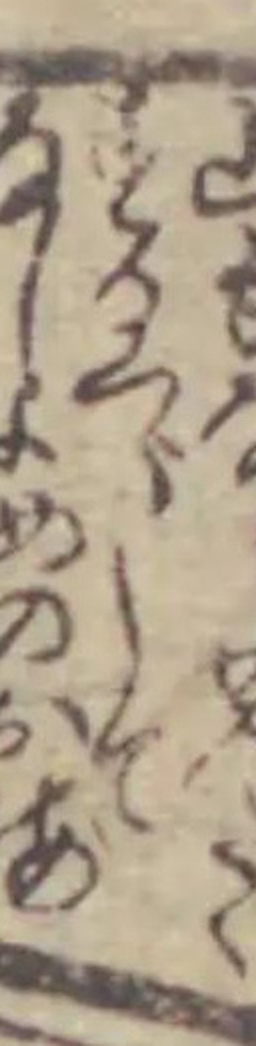なしよめのお梅
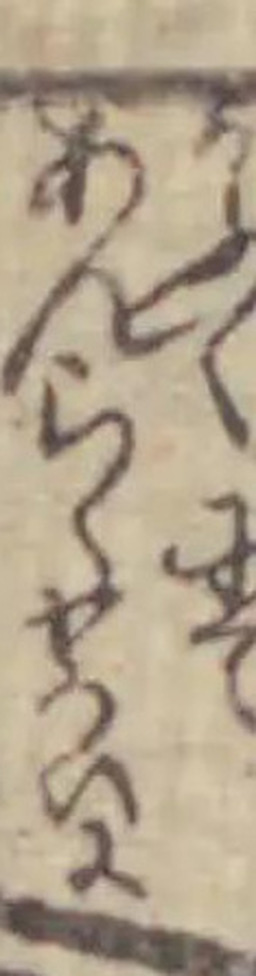あんらくせかいに
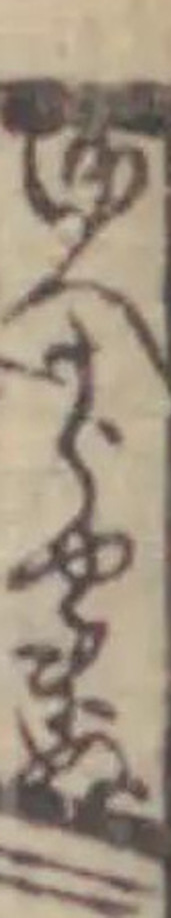ゆへうらやまぬ
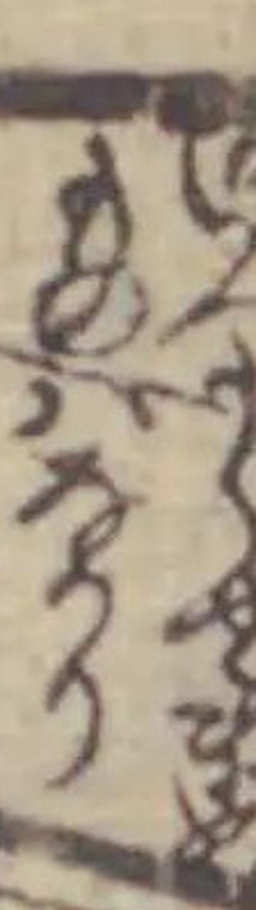ものはなかり
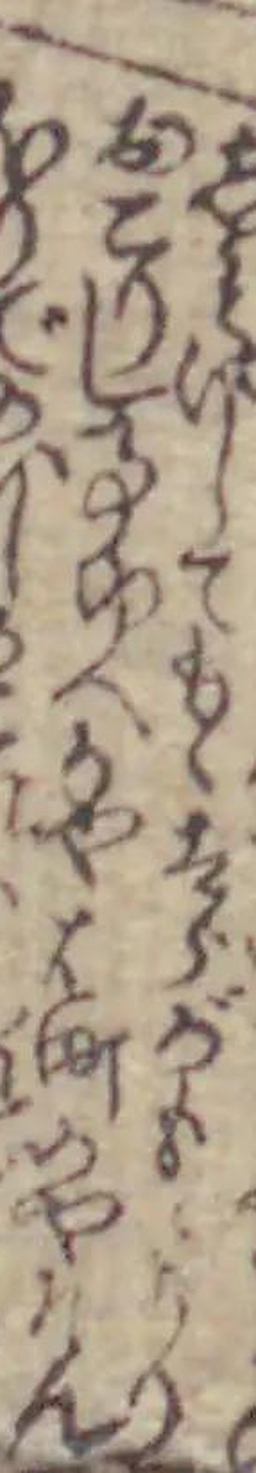おこりし事ゆへかやは町かやけん
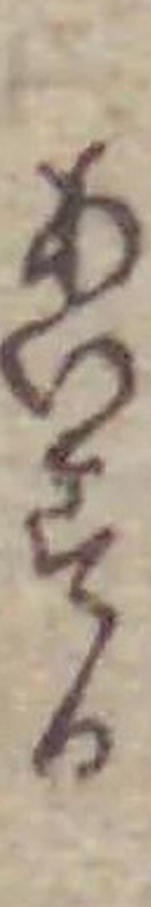あいする
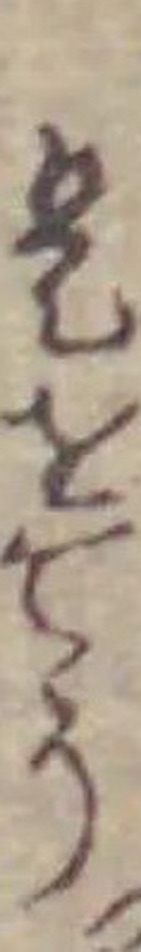是をてう
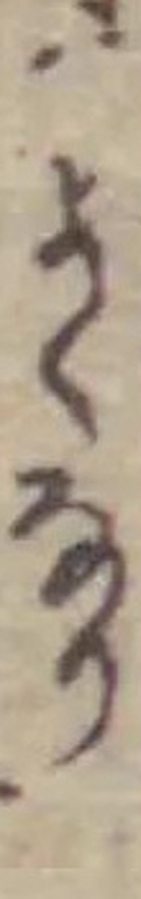よくなり

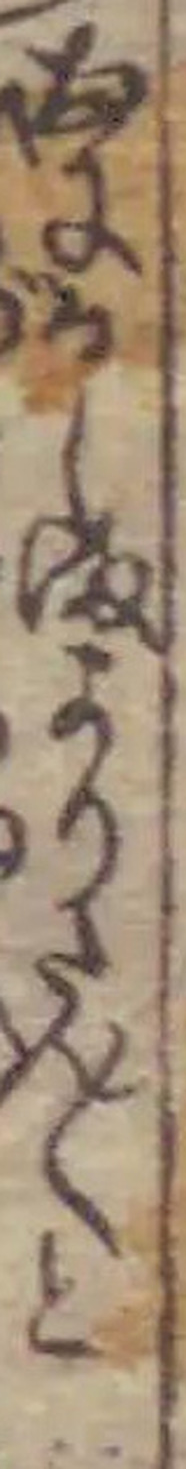おにかしまよりたん〳〵と
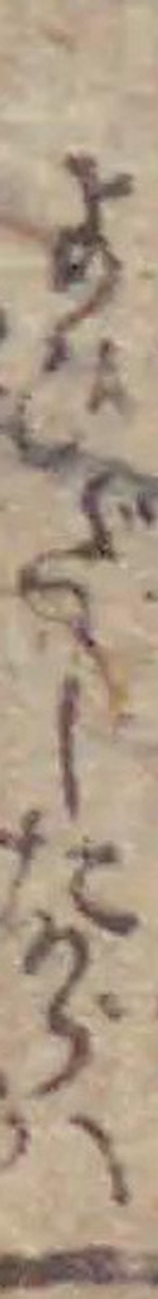よひだしたからは
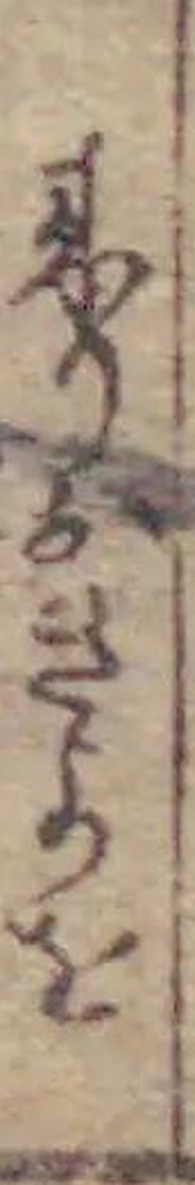来りおきよを
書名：桃太郎元服姿 2巻
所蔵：国立国会図書館 National Diet Library, JAPAN
